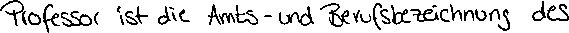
Professor ist die Amts- und Berufsbezeichnung des
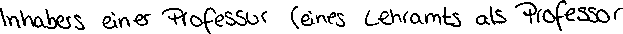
Inhabers einer Professur (eines Lehramts als Professor
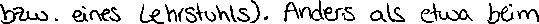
bzw. eines Lehrstuhls). Anders als etwa beim
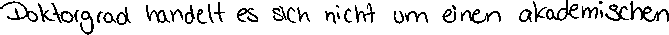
Doktorgrad handelt es sich nicht um einen akademischen
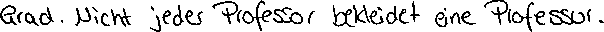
Grad. Nicht jeder Professor bekleidet eine Professur.
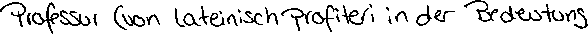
Professur (von lateinisch profiteri in der Bedeutung
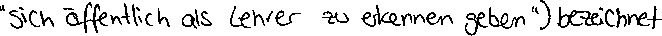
"sich öffentlich als Lehrer zu erkennen geben") bezeichnet
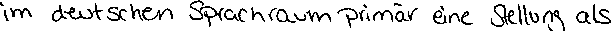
im deutschen Sprachraum primär eine Stellung als
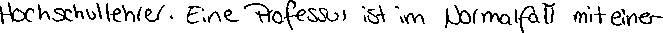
Hochschullehrer. Eine Professur ist im Normalfall mit einer
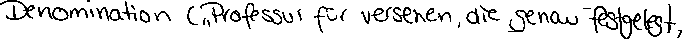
Denomination ("Professur für versehen, die genau festlegt,
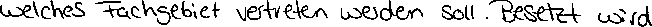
welches Fachgebiet vertreten werden soll. Besetzt wird
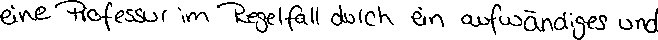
eine Professur im Regelfall durch ein aufwändiges und
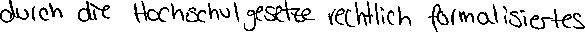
durch die Hochschulgesetze rechtlich formalisiertes
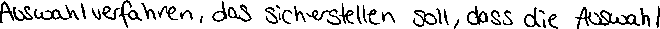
Auswahlverfahren, das sicherstellen soll, dass die Auswahl
